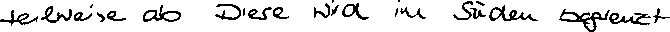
teilweise ab. Diese wird im Süden begrenzt
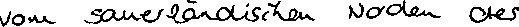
om sauerländischen Norden des
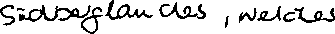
Süderberglandes, welches
